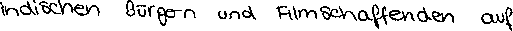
indischen Bürgern und Filmschaffenden auf
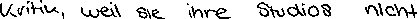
Kritik, weil sie ihre Studios nicht
